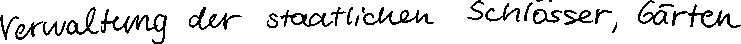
Verwaltung der staatlichen Schlösser, Gärten
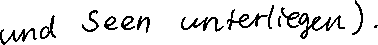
und Seen unterliegen).
